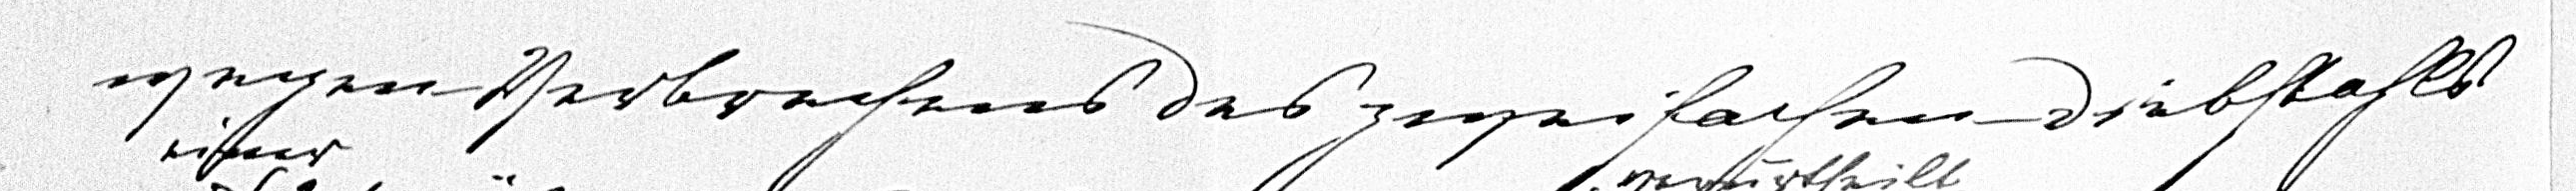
wegen Verbrechens des zweifachen diebstahls
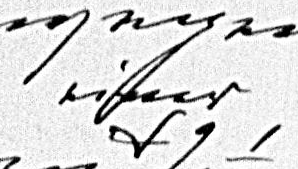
einer
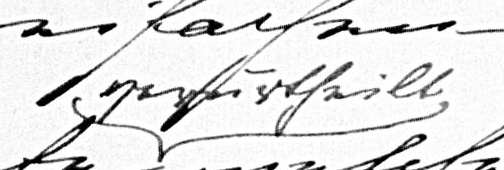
verurtheilt
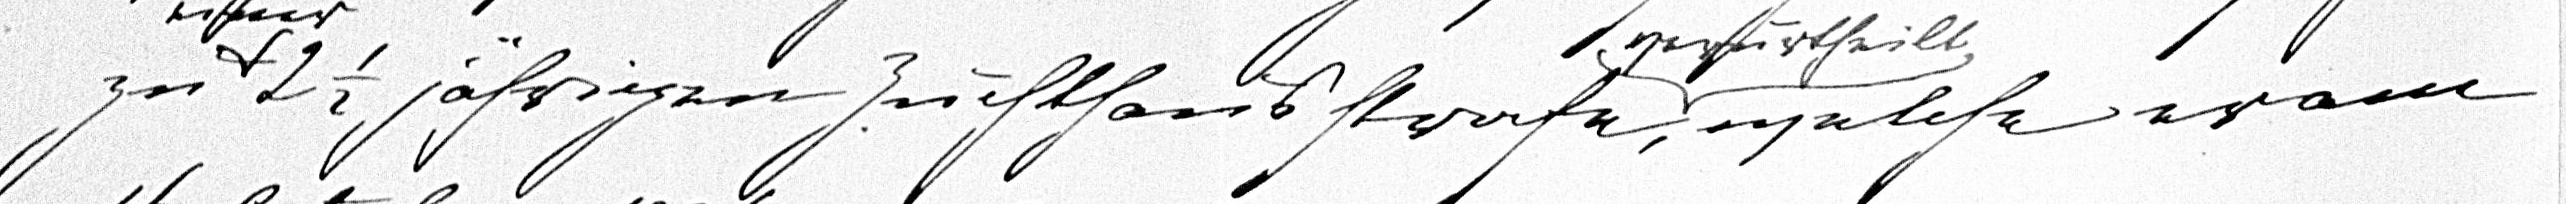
zu & 2 1/2 jährigen Zuchthaus strafe, welche er am
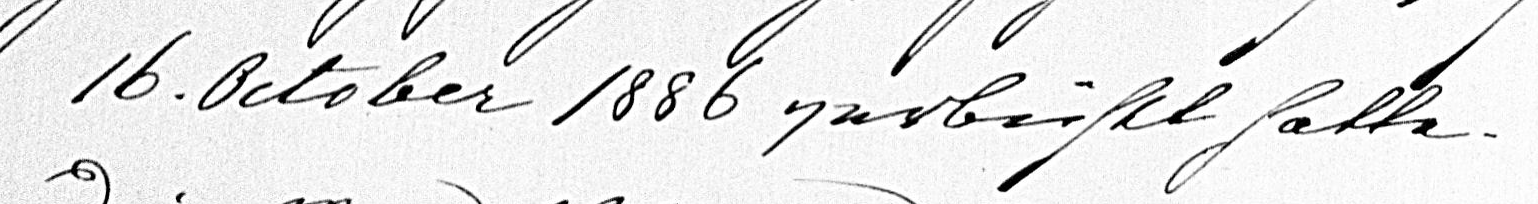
16. October 1886 verbühlt hatte.
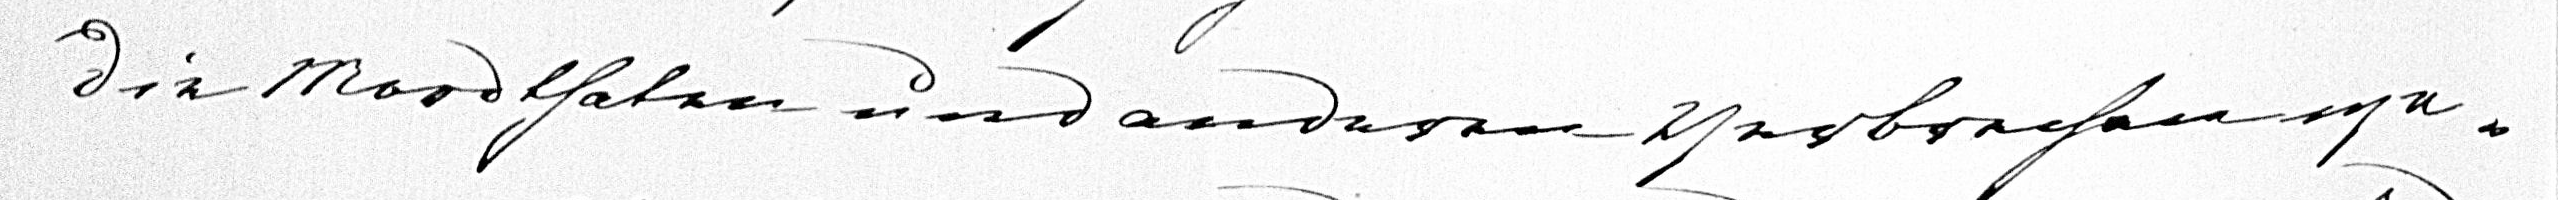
Die Mordthaten und anderen Verbrechen we¬
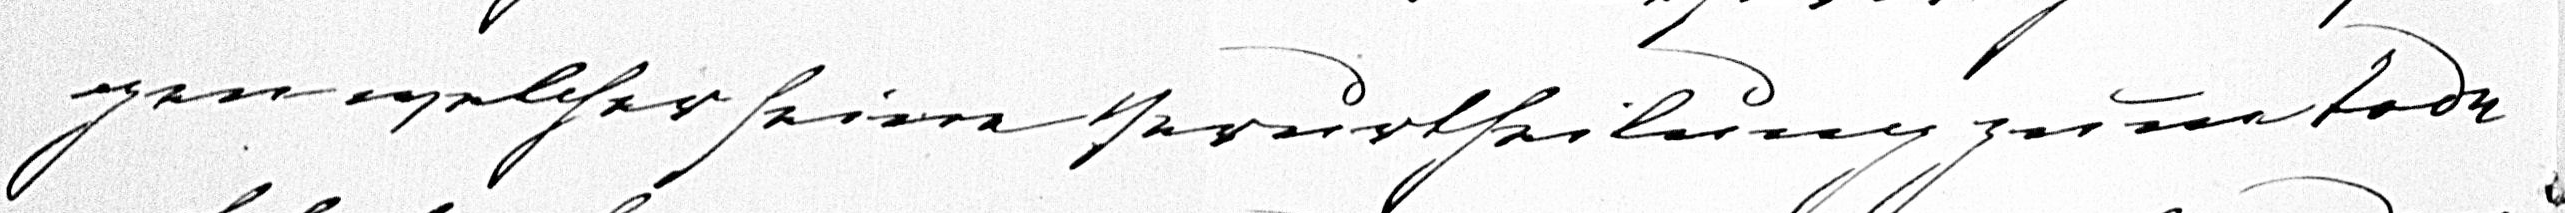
gen welcher seine Verurtheilung zum Tode
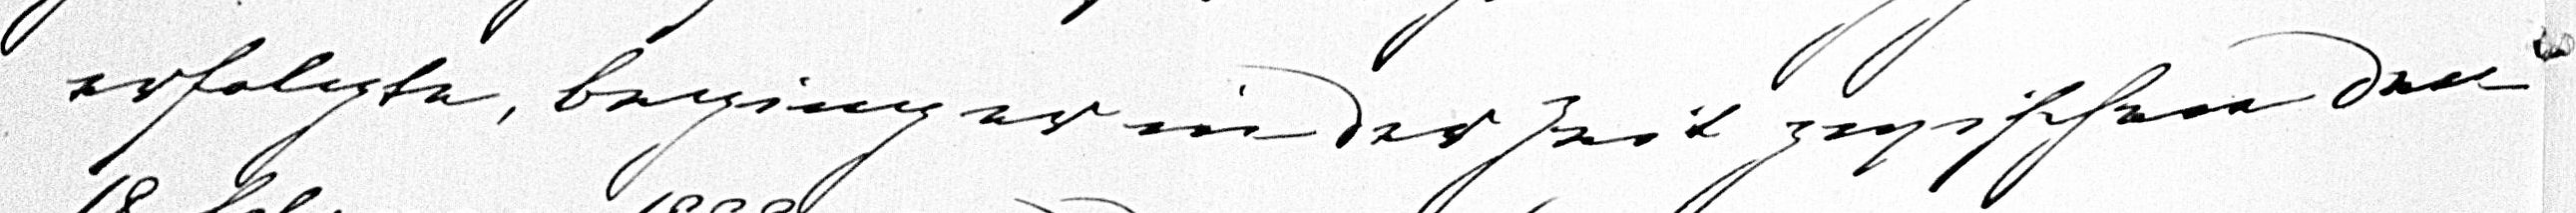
erfolgte, beging er in der zeit zwischen den
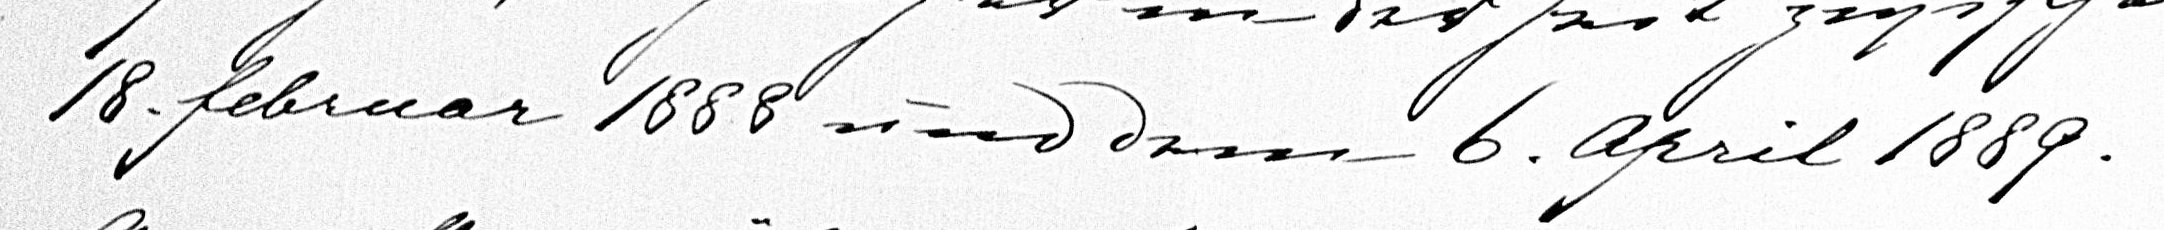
18. Februar 1888 und dem 6. April 1889.
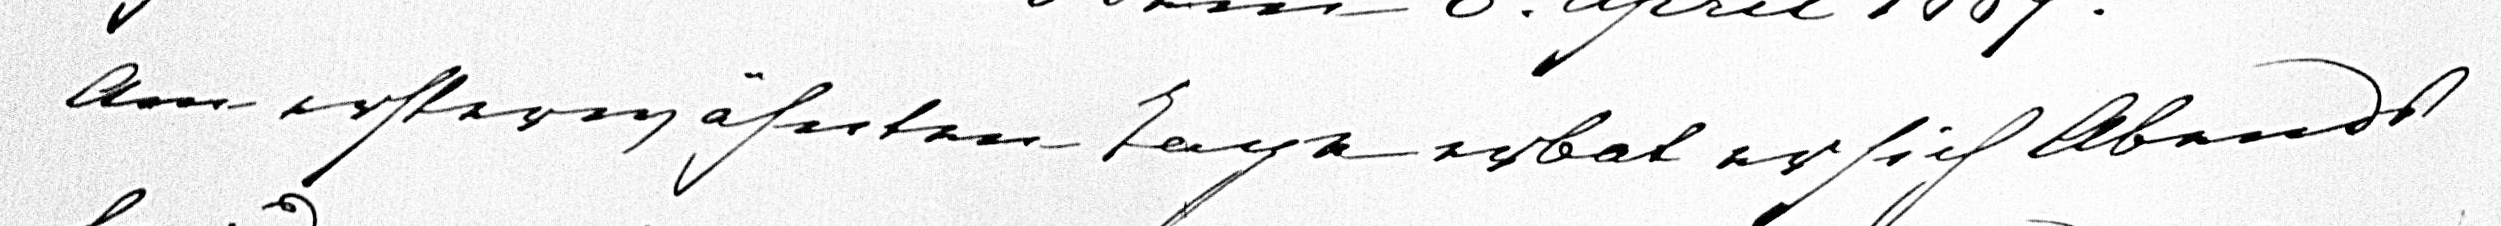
Am ersterwähnten Tage erbat er sich Abends
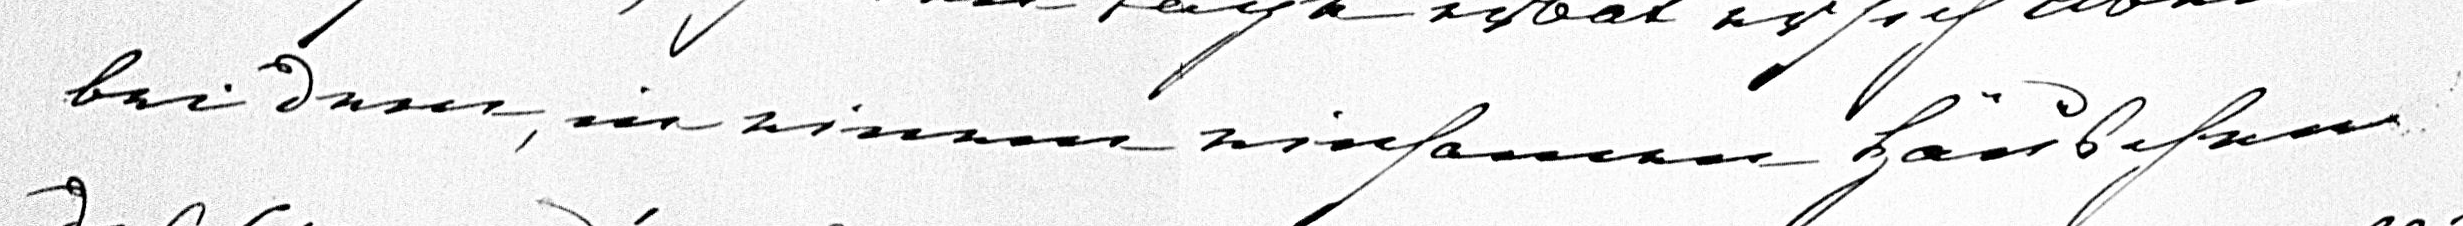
bei dem, in einem einsamen Häuschen
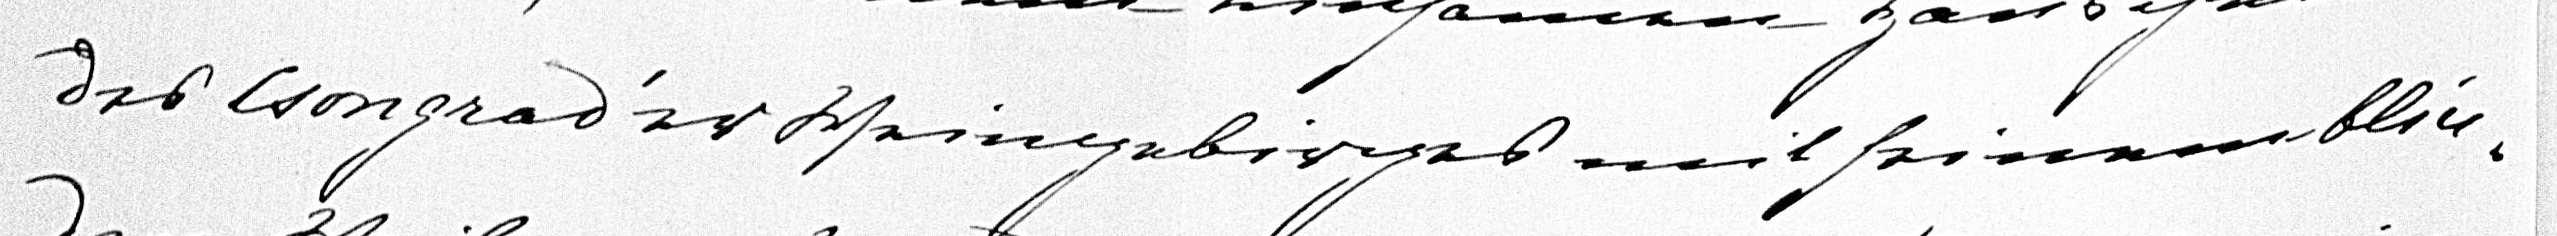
des csongrad'er Weingebirges mit seinem blin¬
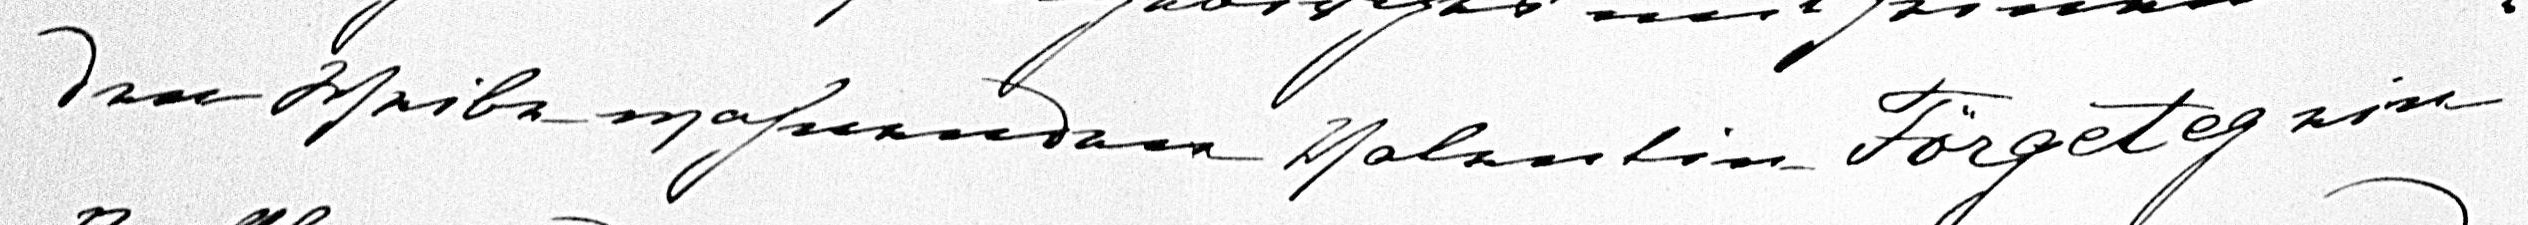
den Weibe mahnenden Valentin Förgeteg ein
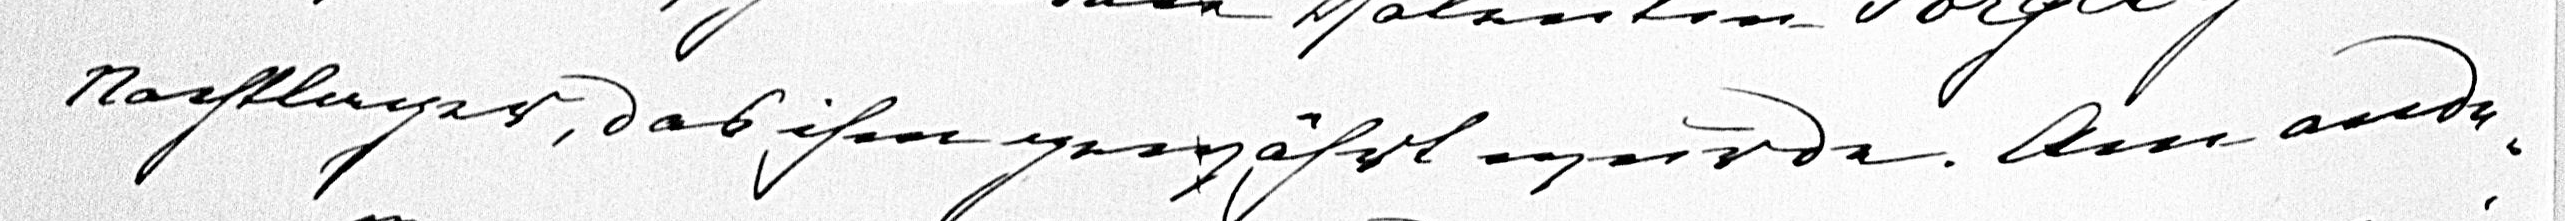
Nachtlager, das ihm gewährt wurde. Am ande¬
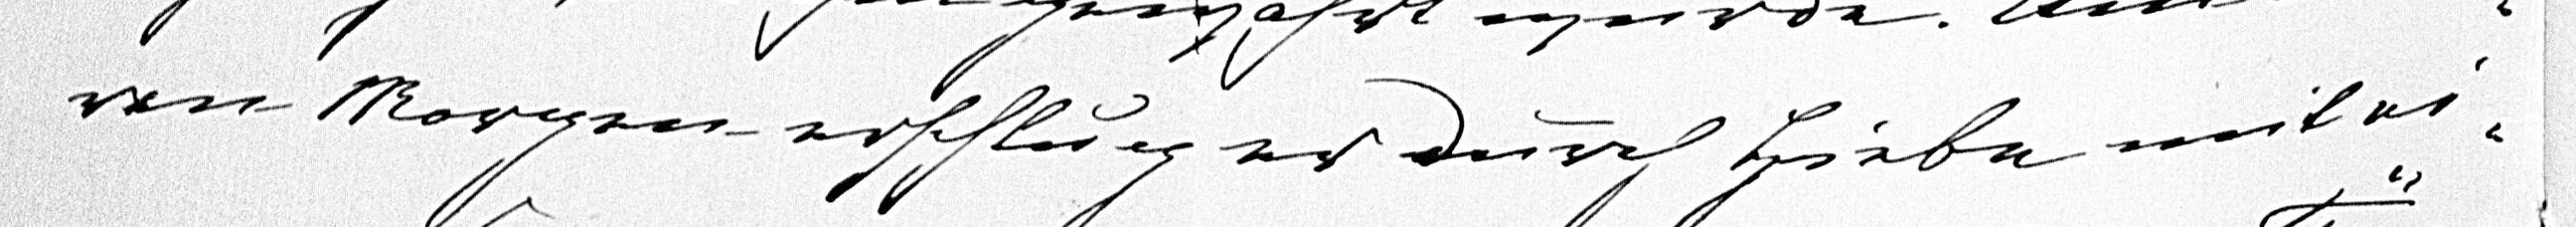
ren Morgen erschlug er durch Hiebe mit ei¬
